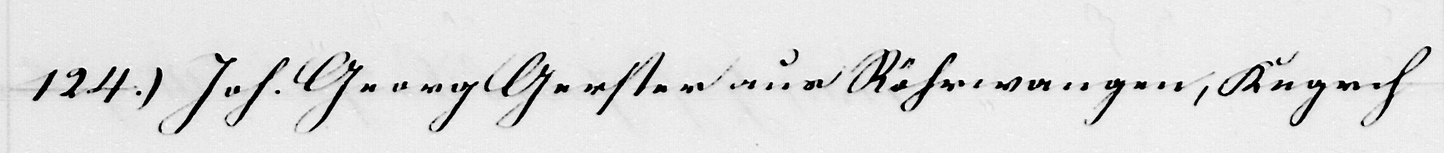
124.) Joh. Georg Gerster aus Röhrwangen, Kngrch
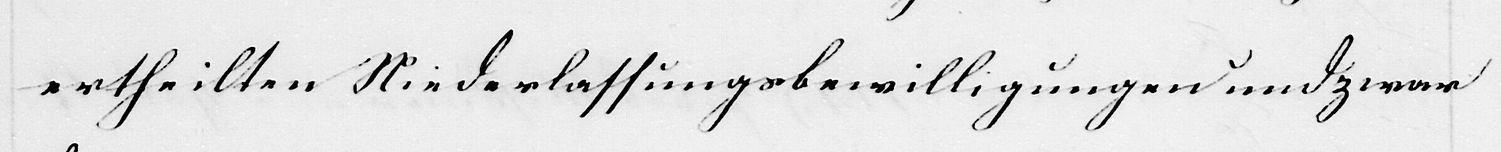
ertheilten Niederlassungsbewilligungen und zwar
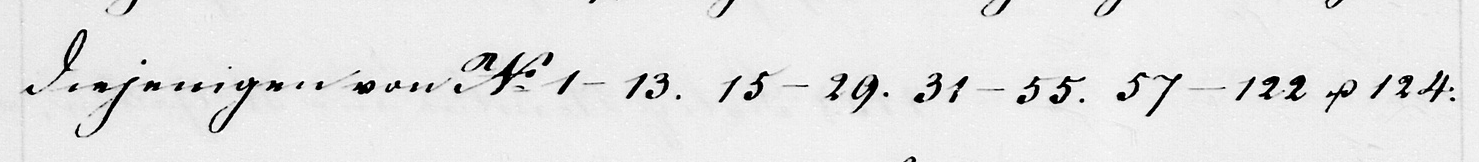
diejenigen von No 1−13. 15−29. 31−55. 57−122 u. 124:
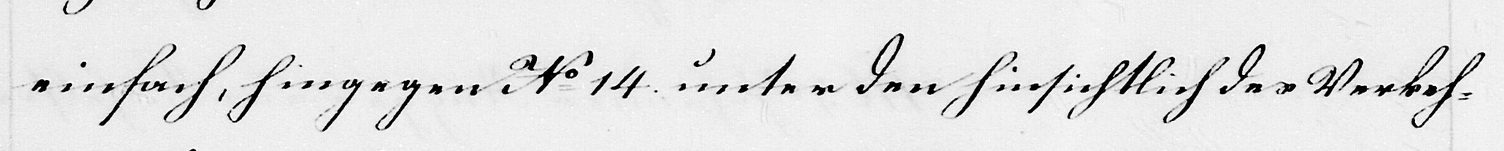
einfach, hingegen No 14. unter den hinsichtlich des Verkeh¬
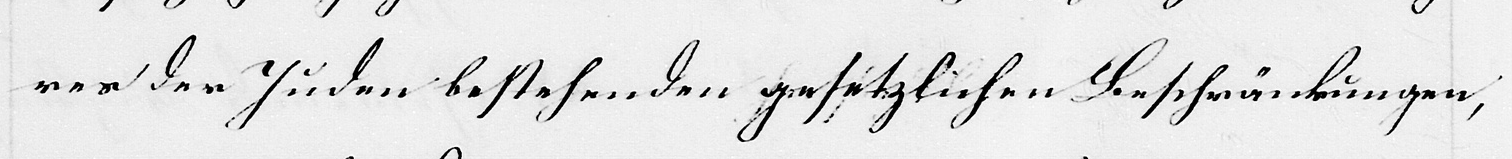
res der Juden bestehenden gesetzlichen Beschränkungen,
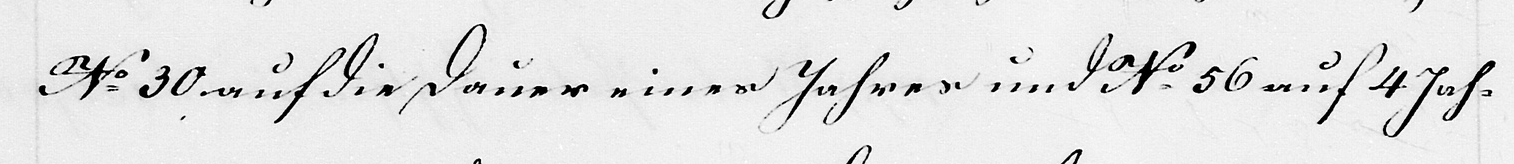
No 30 auf die Dauer eines Jahres und No 56 auf 4 Jah¬
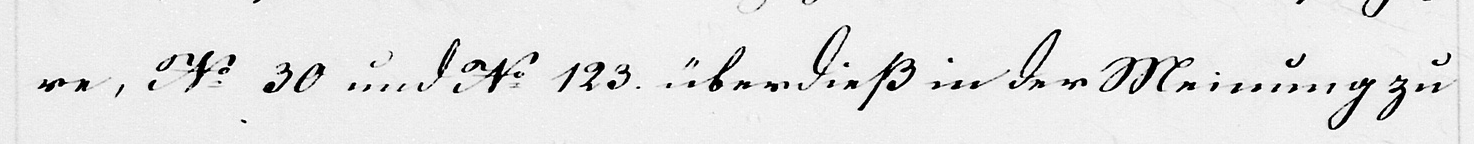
re, No 30 und No 123. überdieß in der Meinung zu
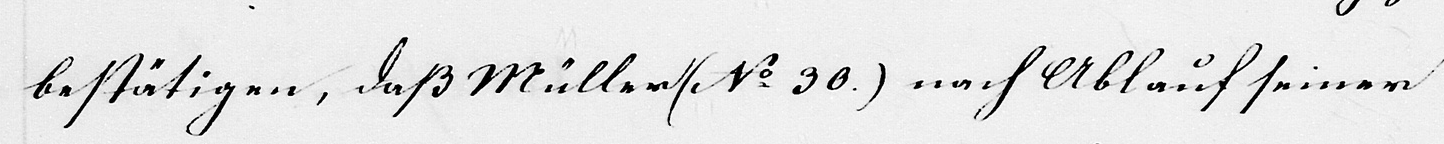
bestätigen, daß Müller (No 30.) nach Ablauf seiner
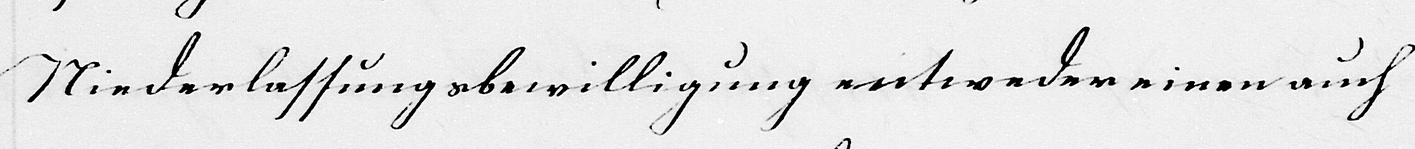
Niederlassungsbewilligung entweder einen auch
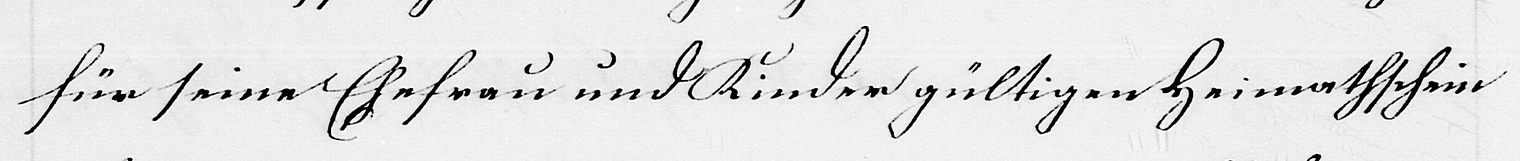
für seine Ehefrau und Kinder gültigen Heimathschein
